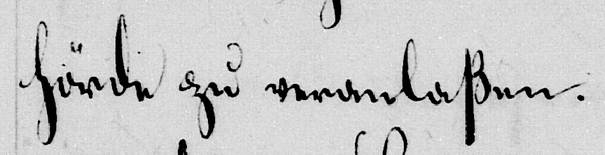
hörde zu veranlaßen.
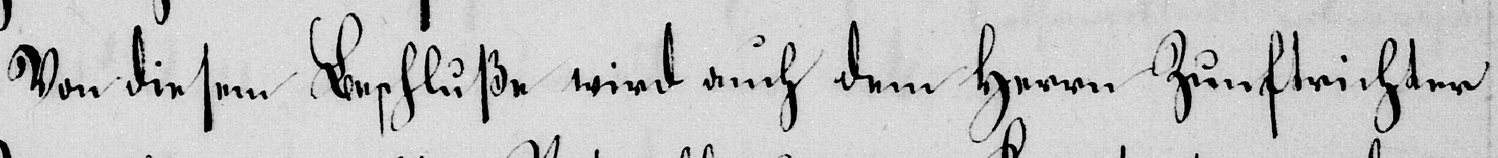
Von diesem Beschluße wird auch dem Herrn Zunftrichter
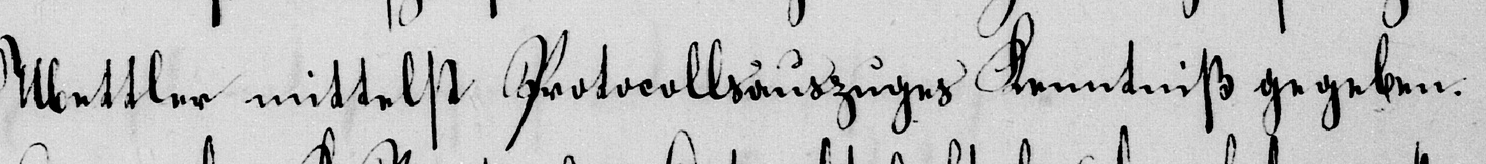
Mettler mittelst Protokollsauszuges Kenntniß gegeben.
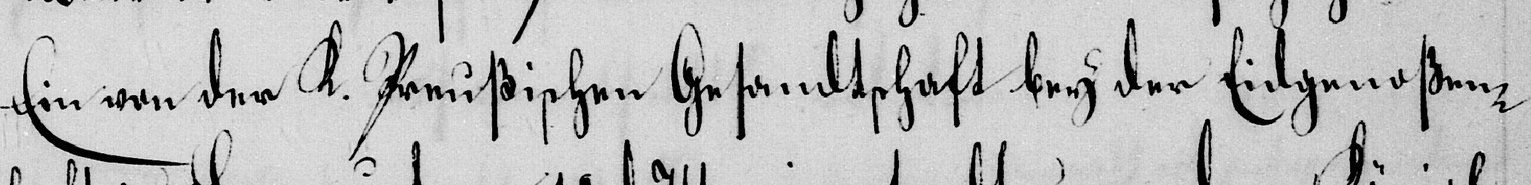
Ein von der K. Preußischen Gesandtschaft bey der Eidgenoßensc¬
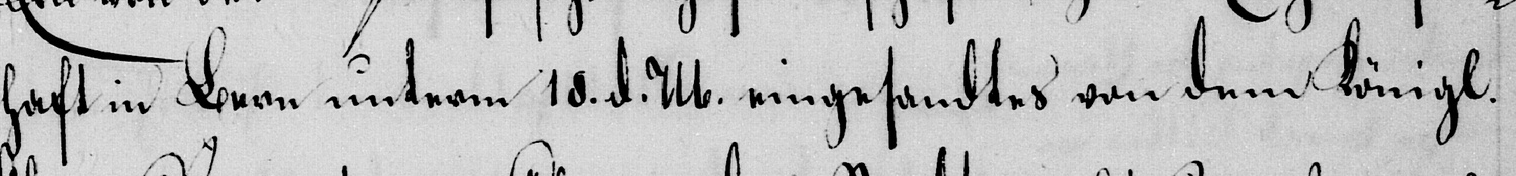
haft in Bern unterm 18. d. M. eingesandtes von dem Königl.
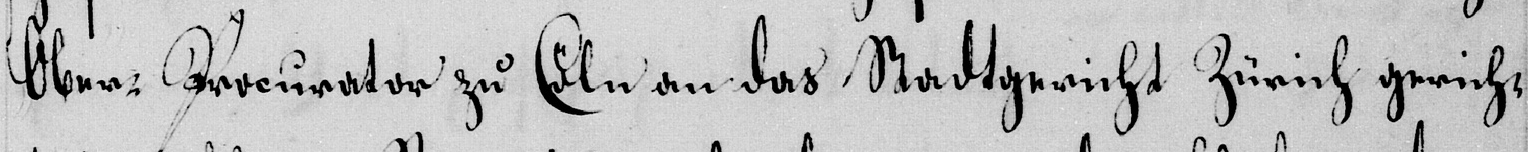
Ober: Procurator zu Cöln an das Stadtgericht Zürich gerich¬
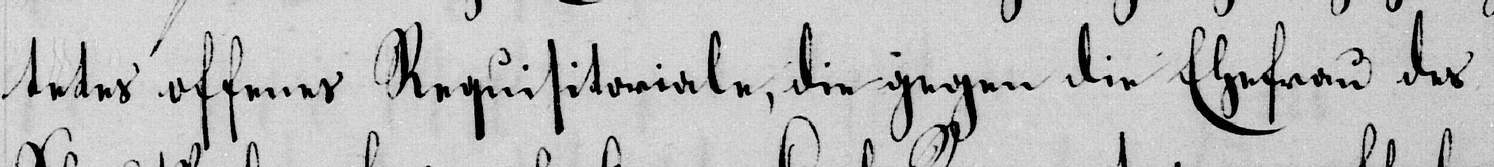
tetes offenes Requisitoriale, die gegen die Ehefrau des
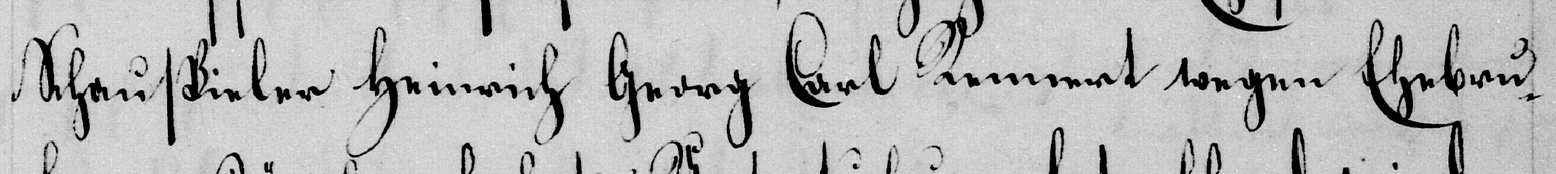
Schauspieler Heinrich Georg Carl Rennert wegen Ehebru¬
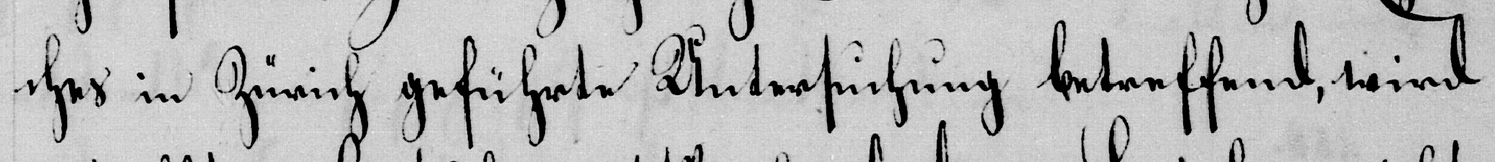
ches in Zürich geführte Untersuchung betreffend, wird
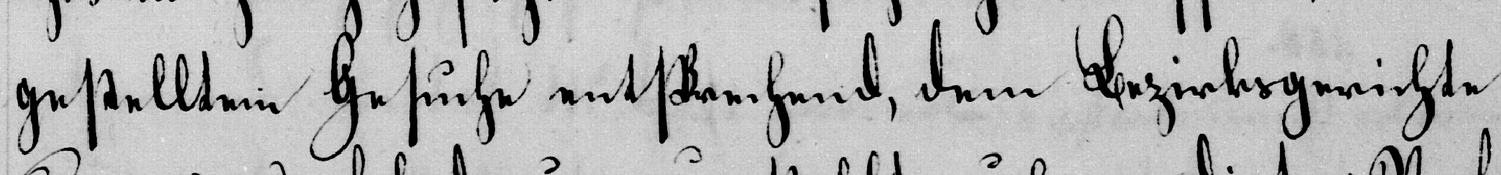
gestelltem Gesuche entsprechend, dem Bezirksgerichte
